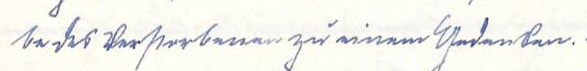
be des Verstorbenen zu einem Gedenken.-
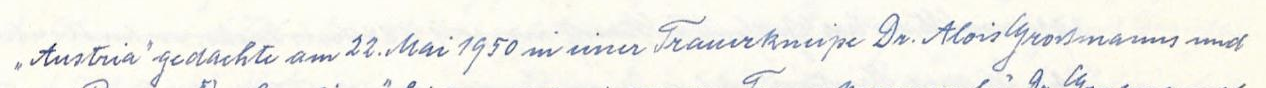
„Austria“ gedachte am 2. Mai 1950 in einer Trauerkneipe Dr. Alois Großmann und
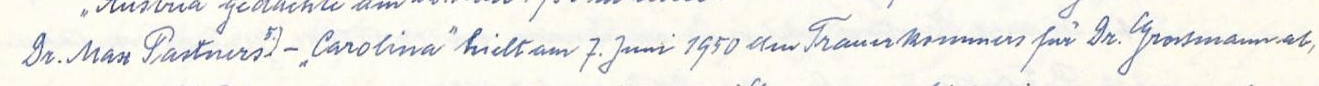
Dr. Max Pastners. 5) „Carolina“ hielt am 7. Juni 1950 den Trauerkommers für Dr. Großmann ab,
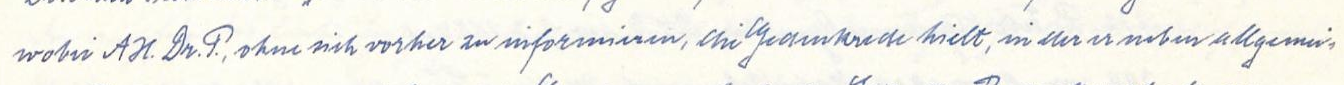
wobei AH Dr. P. ohne sich vorher zu informieren, die Grabrede hielt, in der er neben allgemei
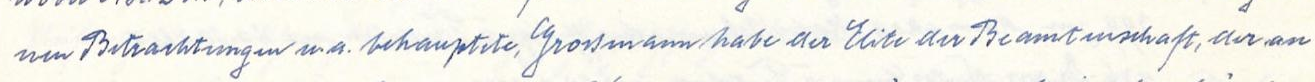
nen Betrachtungen u. a. behauptete, Großmann habe der Elite der Beamtenschaft, der an
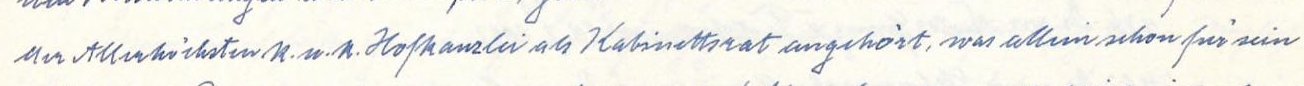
der Allerhöchsten k. u. k. Hofkanzlei als Kabinettsrat angehört, was allein schon für sein
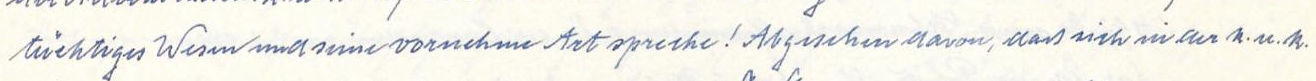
tüchtiges Wesen und seine vornehme Art spreche! Abgesehen davon, dass sich in der k. u. k. .
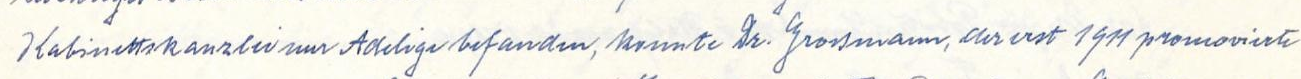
Kabinettskanzlei nur Adelige befanden, konnte Dr. Großmann, der 1911 promovierte
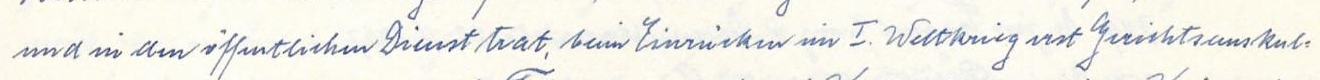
und in den öffentlichen Dienst trat, beim Eindrücken im I. Weltkrieg erst Gerichtsauskul-
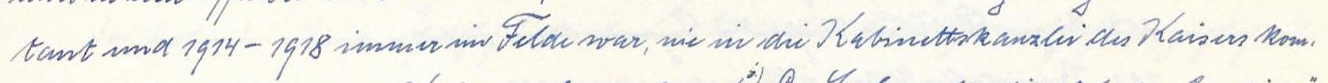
tant und 1914-1918 im Felde war, nie in die Kabinettskanzlei des Kaisers kom-
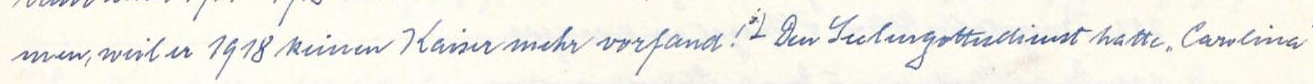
men, weil er 1918 keinen Kaiser mehr vorfand! 7) Den Seelengottesdienst hatte „Carolina“
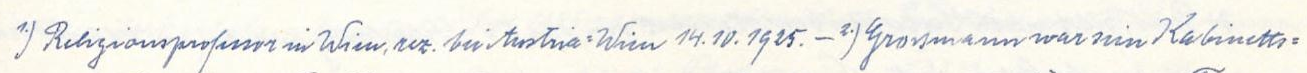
1) Religionsprofessor in Wien, rez. bei Austria-Wien 14.10.1925.- 2) Großmann war nie Kabinetts-
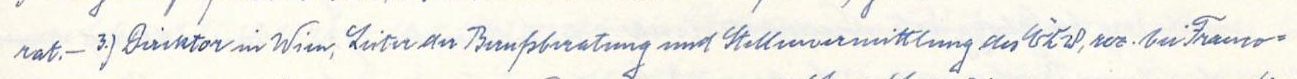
rat.- 3) Direktor in Wien, Leiter der Berufsberatung und StellenVermittlung des OeCV, rez. bei
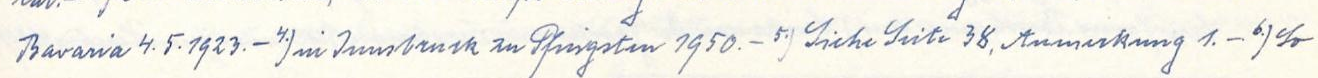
Franco- Bavaria 4.5.1923.- 4) In Innsbruck zu Pfingsten 1950.- 5) Siehe Seite 38 Anmerkung 1.- 6) So
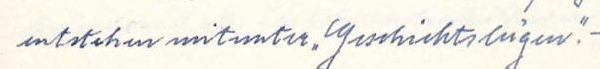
entstehen mitunter „Geschichtslügen.“
